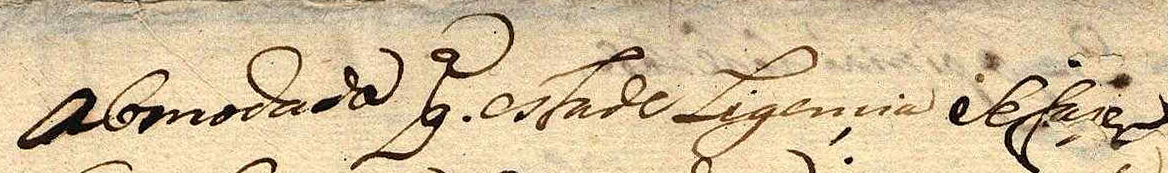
acomodada pa esta deLigencia se fazer
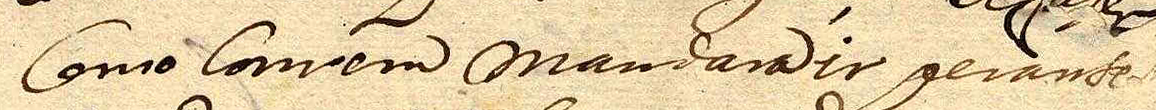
Como Convem mandara ir perante
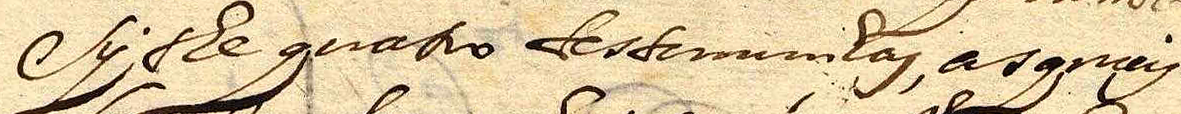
Sy the quatro testemunhas, as quais
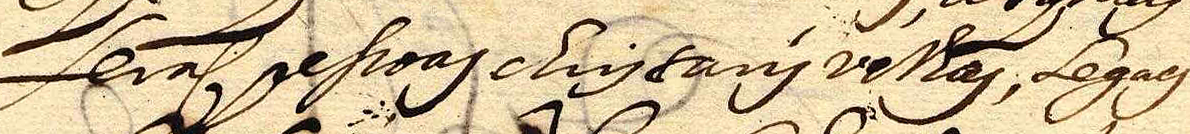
seraõ pessoas christans velhas, Legais
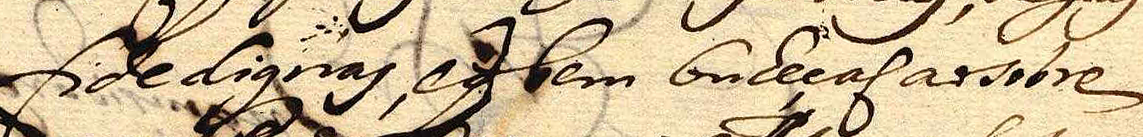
fidedignas, e q̄ bem conheçaꝭ ao sobre
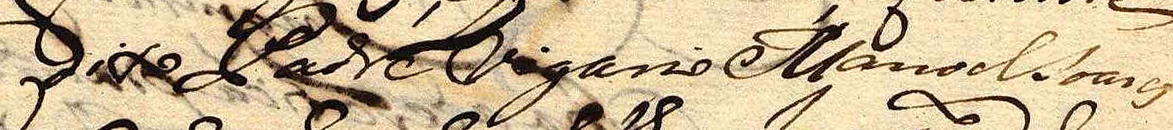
dito Padre Vigario Manoel Soares
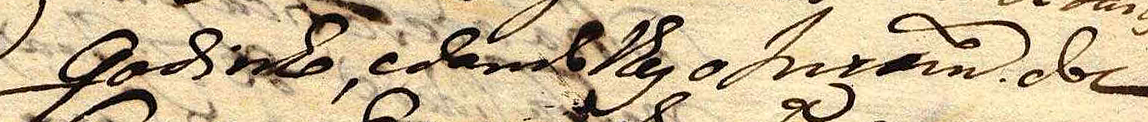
Godinho, e dandolhes o Iuram.to dos
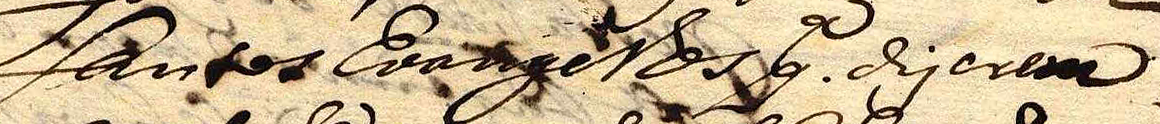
Santos Evangelhos p.a dizerem
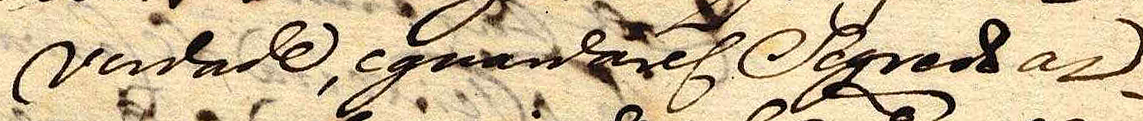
verdade, e guardarē Segredo as
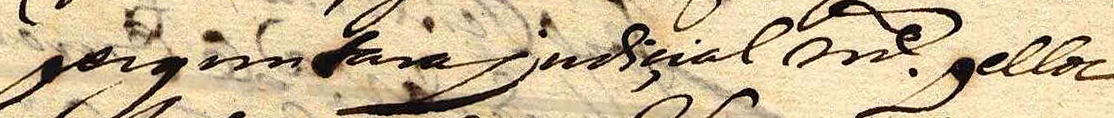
perguntara judicialm.te pellos
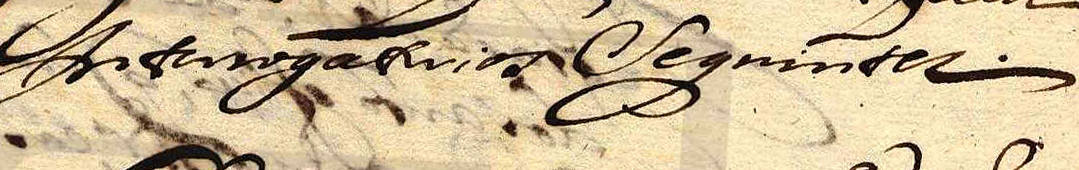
Jnterrogatorios Seguintes.
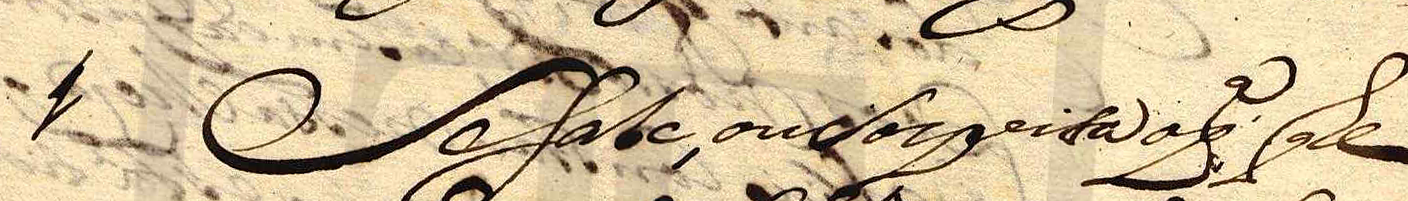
1 Se sabe, ou sospeita o pa q̄ he
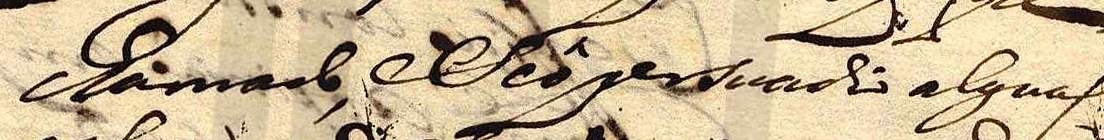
chamado, e Se ô persuadio alguā
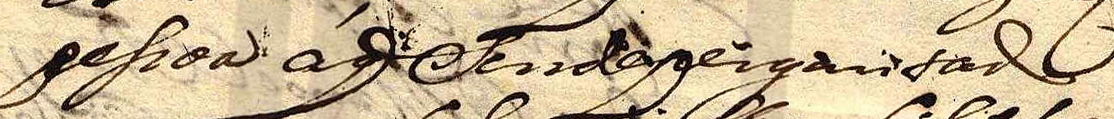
pessoa a q̄ sendo perguntado
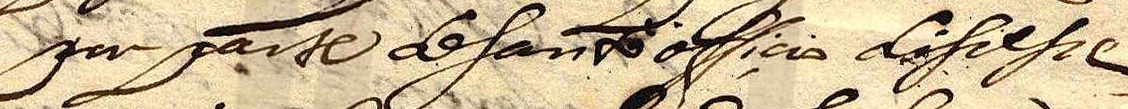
por parte do santo officio dissesse
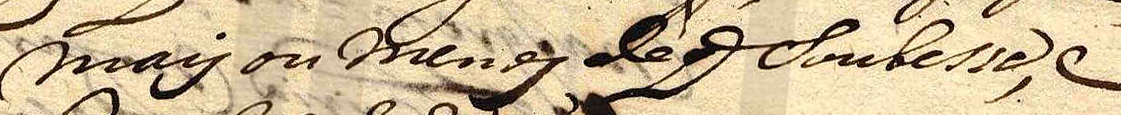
mais ou menos de q̄ Soubesse, e
